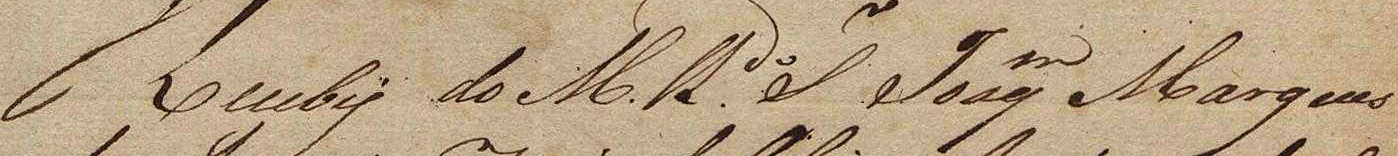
Receby do M. R.do Sr Ioaqm Marques
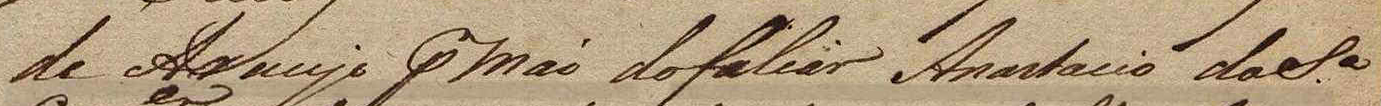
de Aruujo pr maõ do faliar Anastacio da S.a
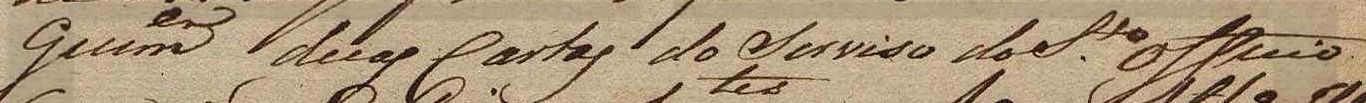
Guimes duas Cartas do Serviso do S.to officio
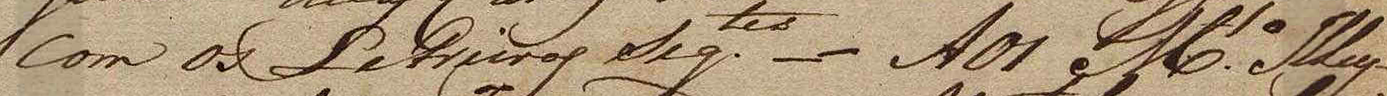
com os Letreiros Seg.tes = Aos M.to Illus
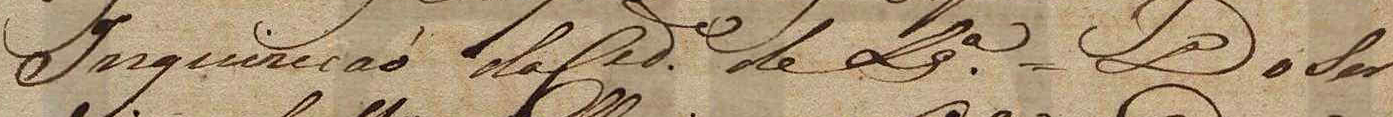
Inquizeçaõ da Cid.e de Lx.a = Do ser
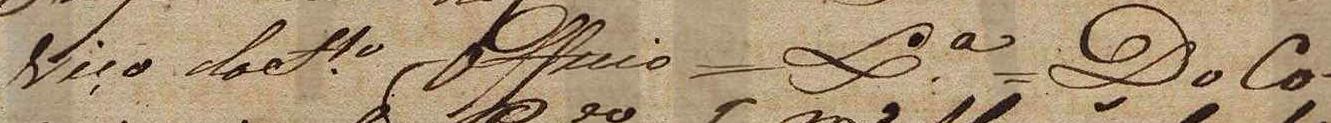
viço do S.to Officio = Lxa = Do Co
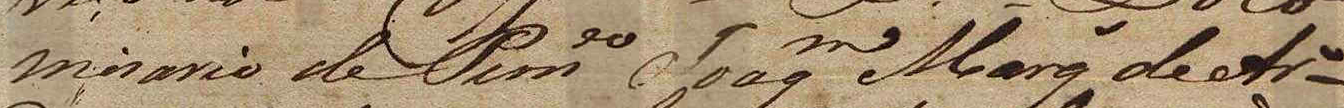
misario de Pern.co Ioaqm Marq̄. de Aro
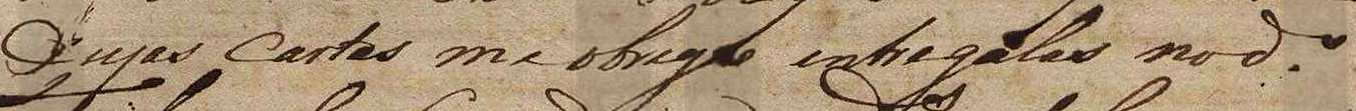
Cujas cartas me obregao entregalas no d.o
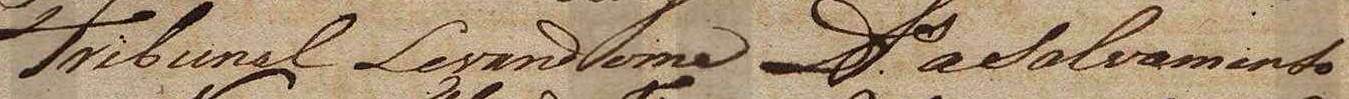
Tribunal Levandome D.s a Salvamento
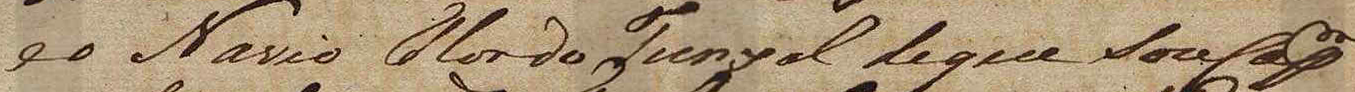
e o Navio Flor do Tunxal de que Sou Capm
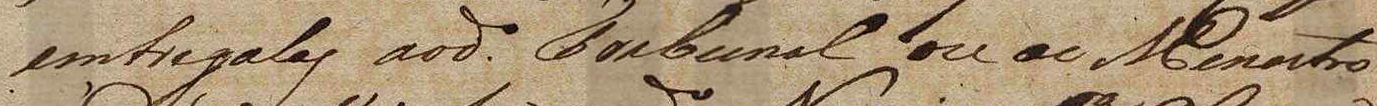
emtregalas ao d.o Trebunal ou ao Menestro
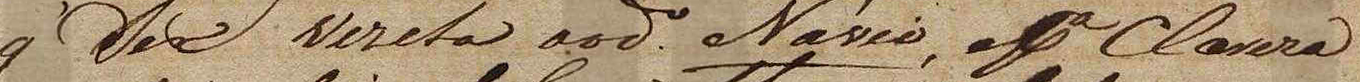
q̄ der vezeta ao d.o Navio, e p.a Clareza
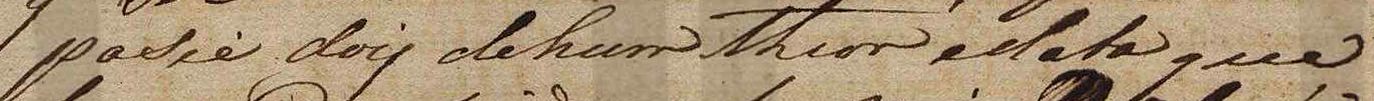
passé dois de hum theor e data que
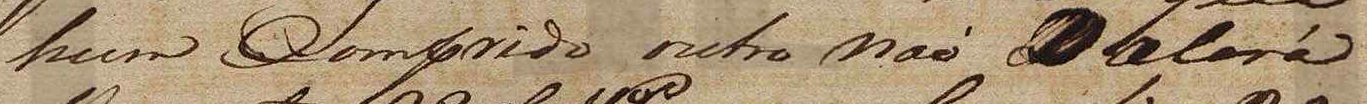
hum Comprido outro naõ Declará
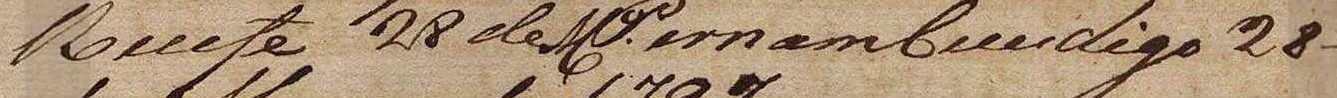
Recefe 28 de M.co Pernambuco digo 28
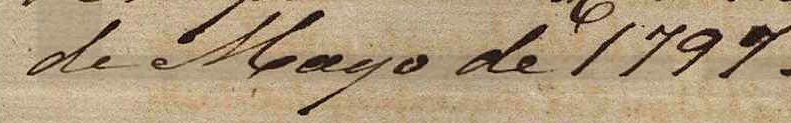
de Mayo de 1797
